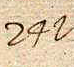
242
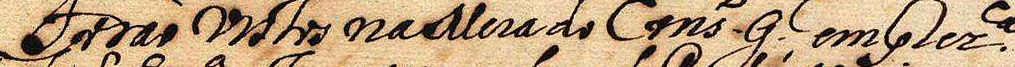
Foraõ vistos na Meza do Cons.o G.l em pRez.ca
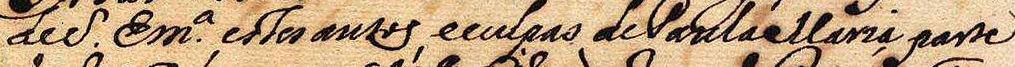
de S. Em.a, estes autos, e culpas de Paula Maria, parte
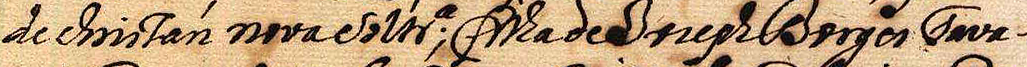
de christan nova soltra; filha de Iozeph Borges Tava
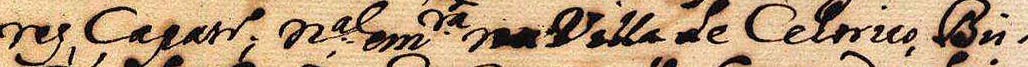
res, Çapatro. n;al e mr.a na Villa de Celorico, Bis
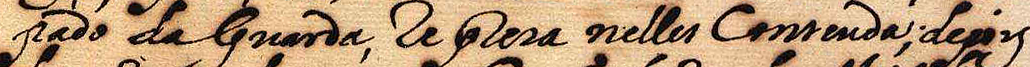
pado da Guarda, Re pReza nelles Conteuda; depois
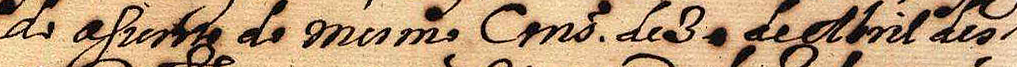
do assento do mesmo Cons̄ de 30 de Abril des
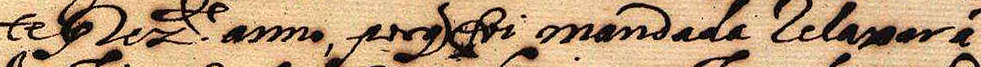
te pRez.te anno, porq̄ foi mandada Relaxar á
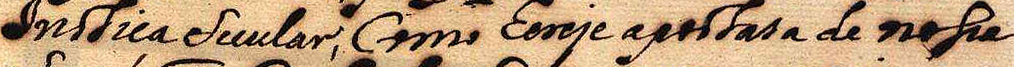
Iustiça Secular, Como hereje apostata de nossa
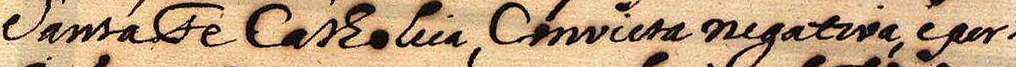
Santa Fe Catholica, Convicta negativa, e per
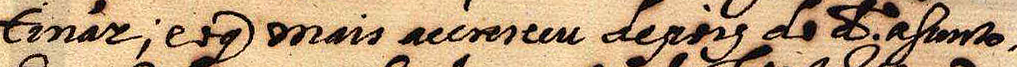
tinaz, e o q̄ mais accresceu depois do d̄.o assento
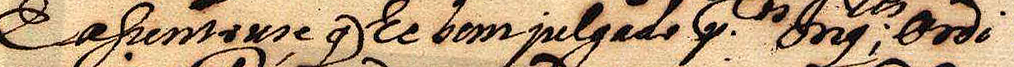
E assentouse q̄ he bem julgado p.los InqRes; Ordi
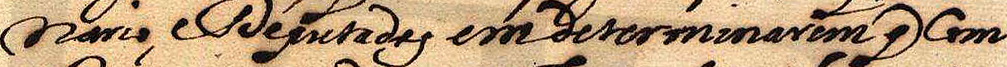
nario, e Deputados em determinarem q̄ Com
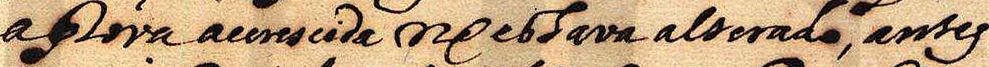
a pRova acrescida nā estava alterada, antes
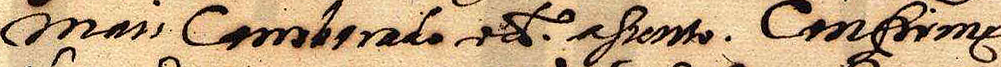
mais Corroborado o d̄.o assento. Confirma
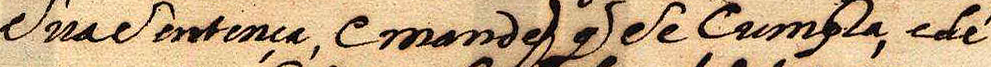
Sua Sentença, e mandē q̄ se Cumpra, e dé
